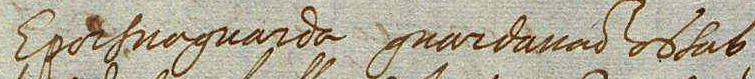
E por sua guarda guardauaõ os sab
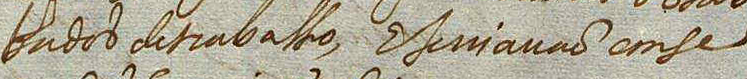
bados de trabalho, E Jeiuauaõ em se
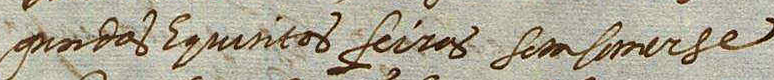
gundas E quintas feiras sem Comer se
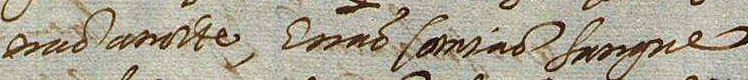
naõ a noite, E naõ Comiaõ sangue
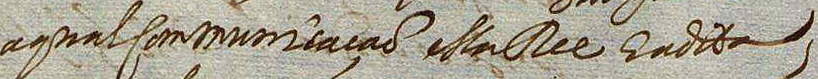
a qual Communicaçaõ ella Ree E a dita
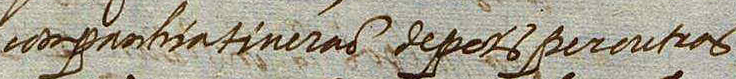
companhia tiueraõ depois per outras
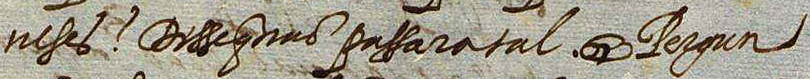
ueses? Disse q̄ naõ passara tal. ⁋ Pergun
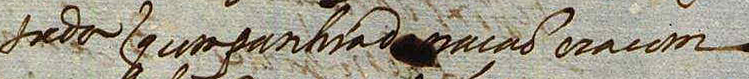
tada q̄ companhia d_ naçaõ era com
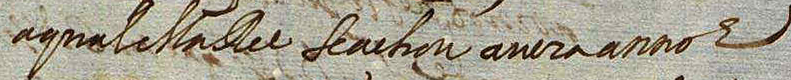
a qual ella Ree se achou auera anno E
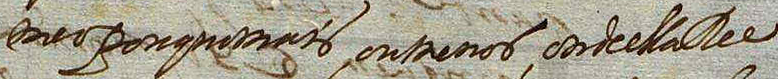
meo pouquo mais, ou menos, onde ella Ree
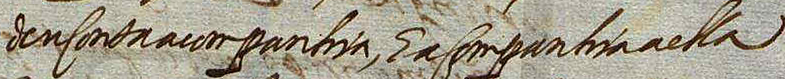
deu Conta a companhia, E a Companhia a ella
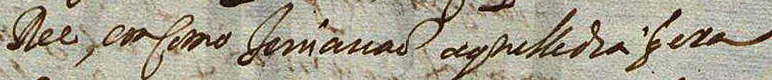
Ree em Como Jeiuauaõ aquelle dia q̄ era
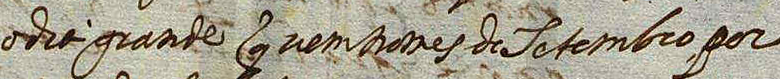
o dia grande q̄ uem no mes de Setembro, por
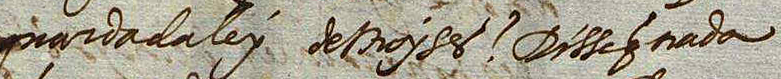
guarda da ley de moyses? Disse q̄ nada
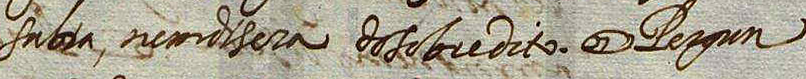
sabia, nem disera do sobredito. ⁋ Pergun
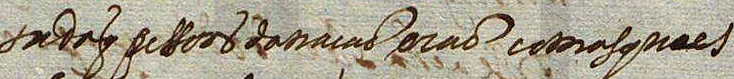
tada q̄ pessoas da naçaõ eraõ com as quaes
